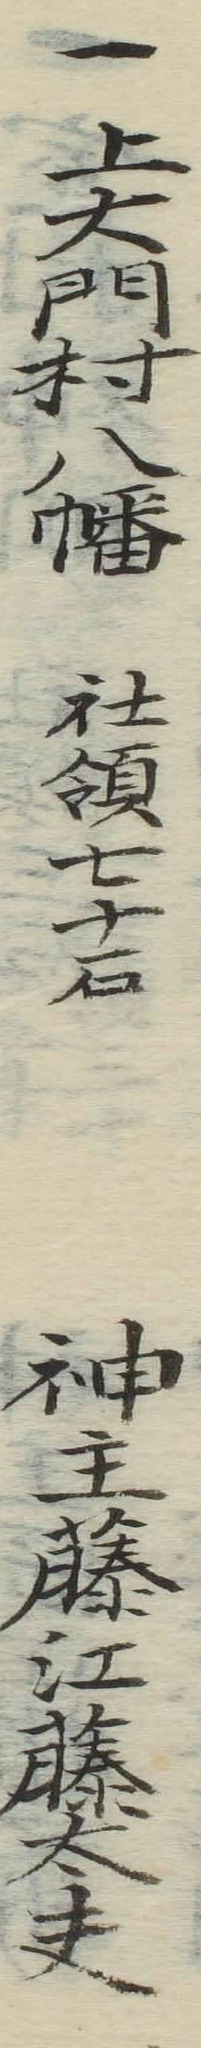一上大門村八幡社領七十石神主藤江藤太夫
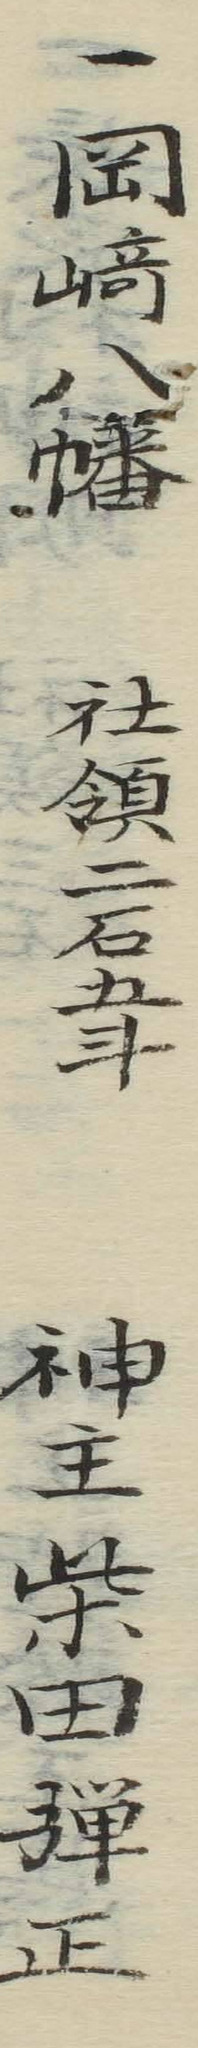一岡崎八幡社領二石五斗神主柴田弾正
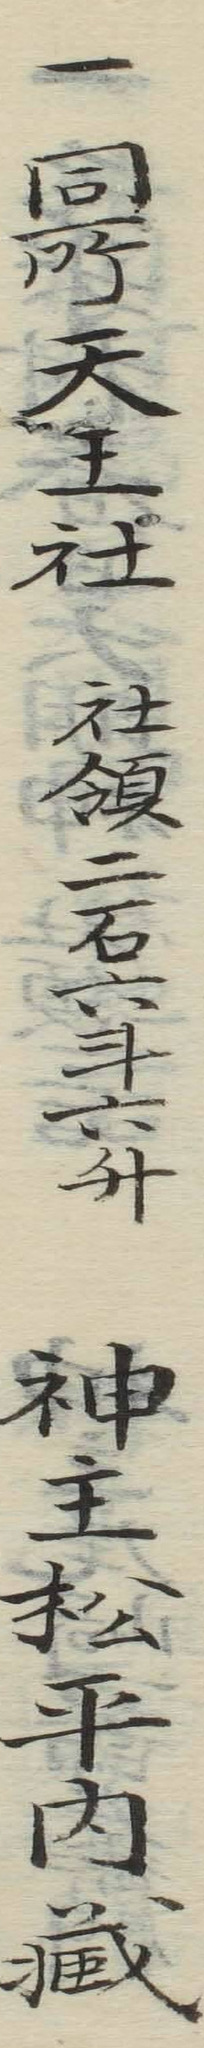一同所天王社社領二石六斗六升神主松平内蔵
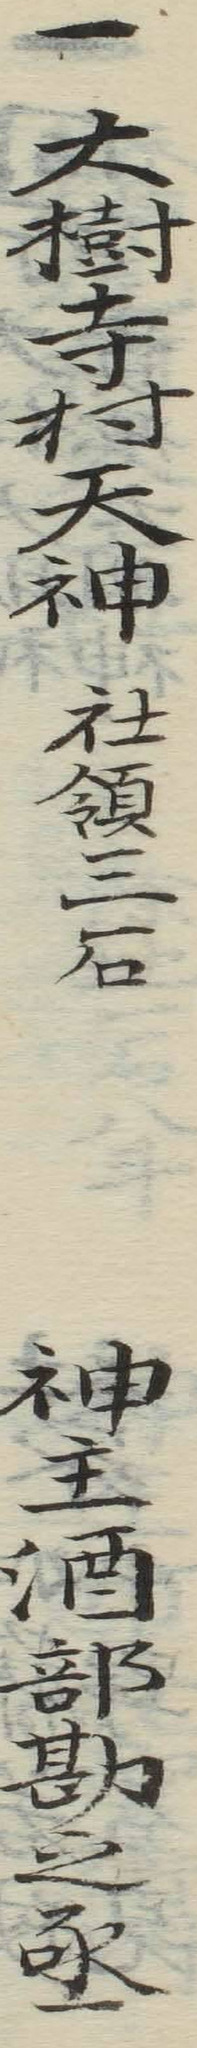一大樹寺村天神社領三石神主酒部勘之丞
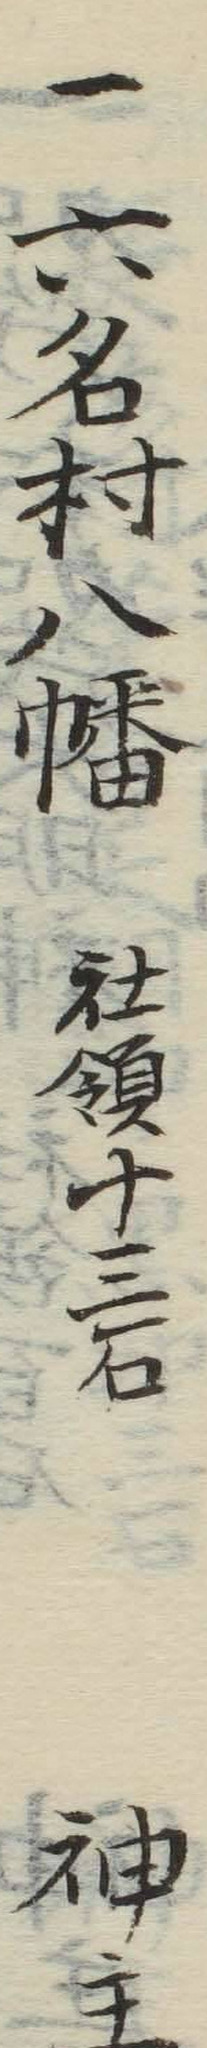一六名村八幡社領十三石神主
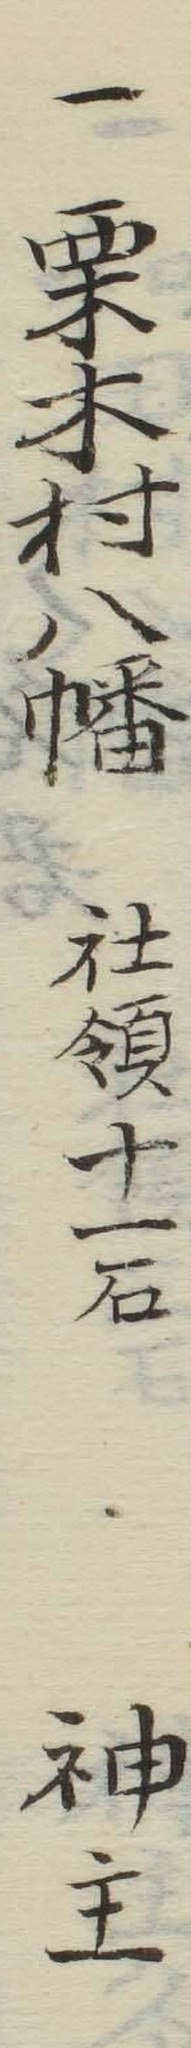一栗木村八幡社領十一石神主
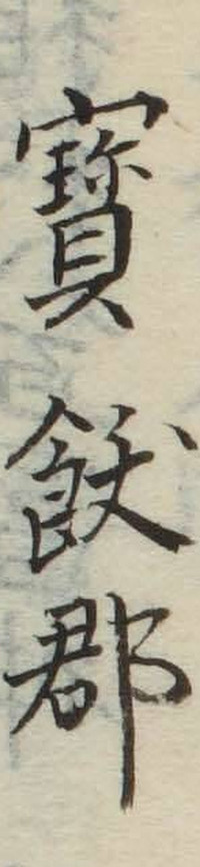宝飫郡
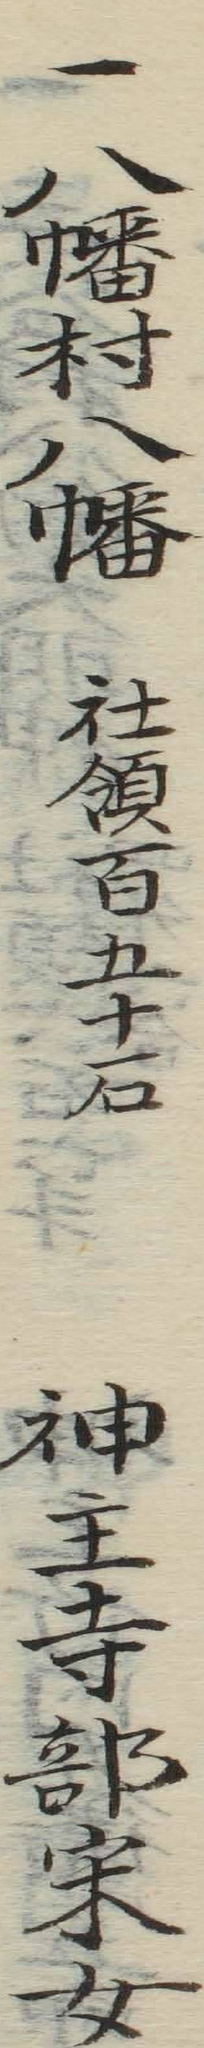一八幡村八幡社領百五十石神主寺部宋女
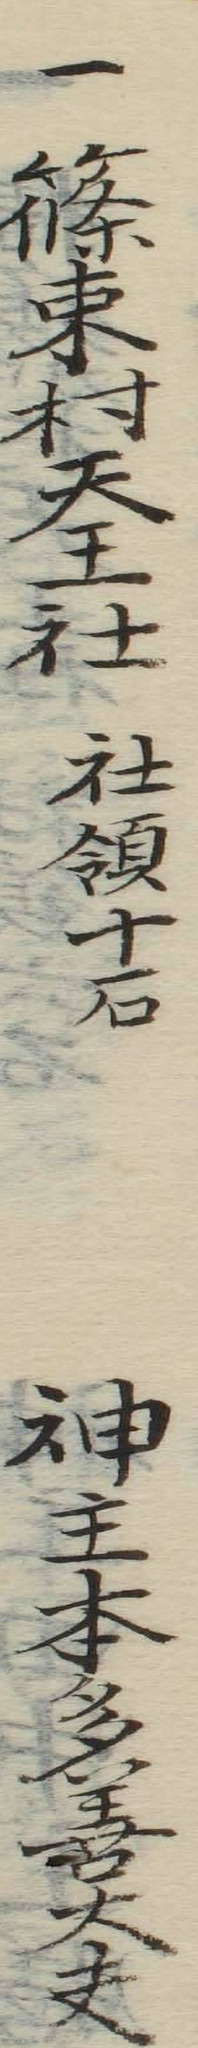一篠束村天王社社領十石神主本多善太夫

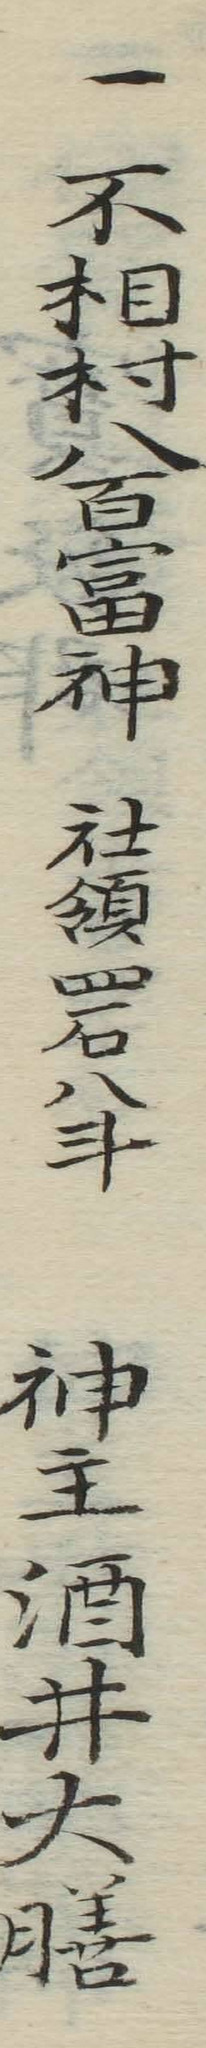一不相村八百富神社領四石八升神主酒井大膳
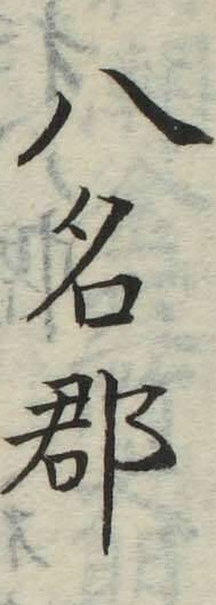八名郡
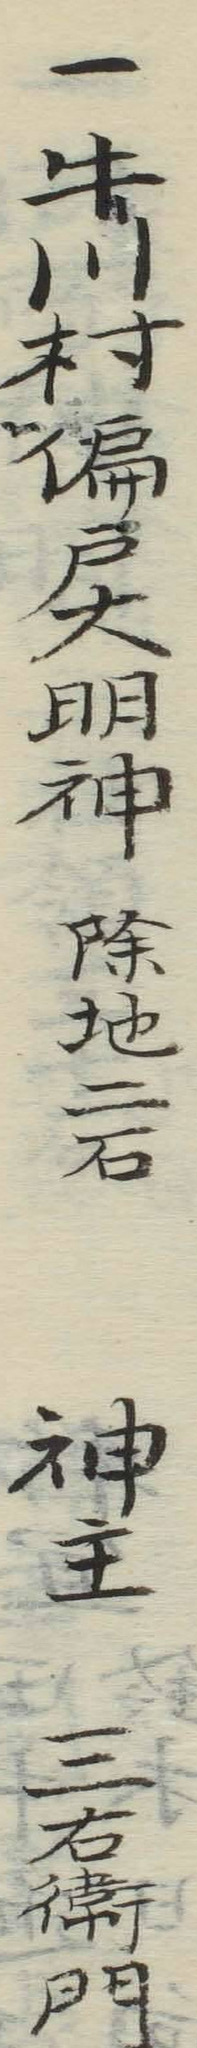一牛川村偏戸大明神除地二石神主三右衛門
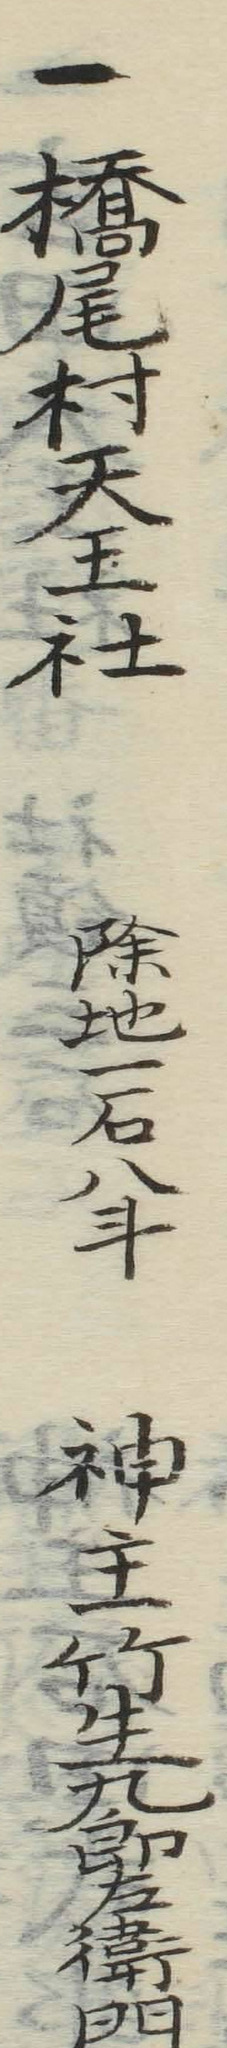一橋尾村天王社除地一石八升神主竹生九郎左衛門
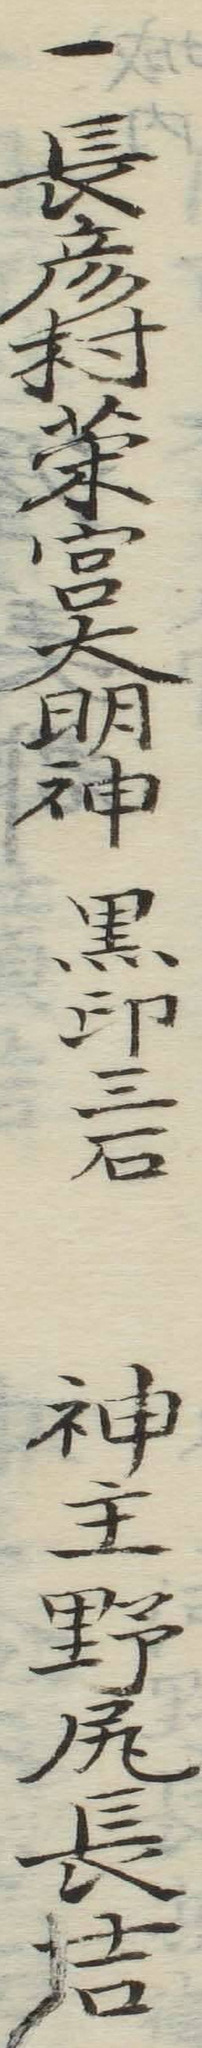一長彦村栄宮大明神黒印三石神主野尻長吉
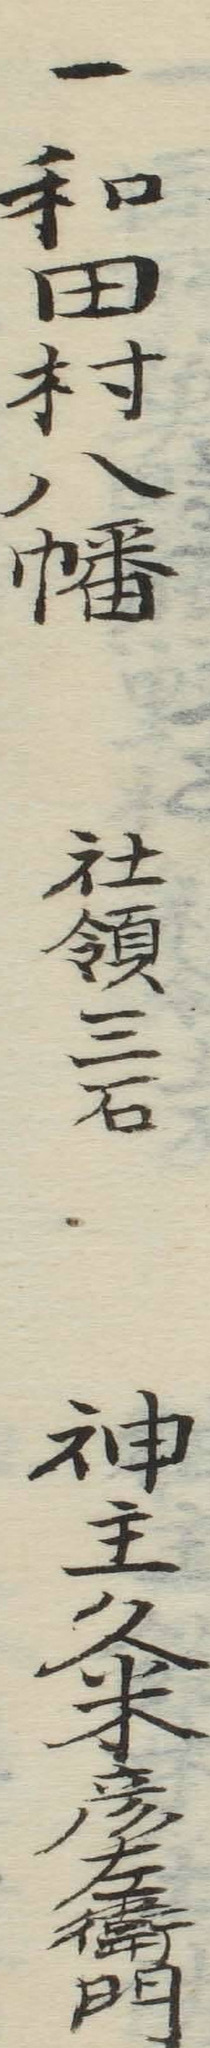一和田村八幡社領三石神主久米彦左衛門
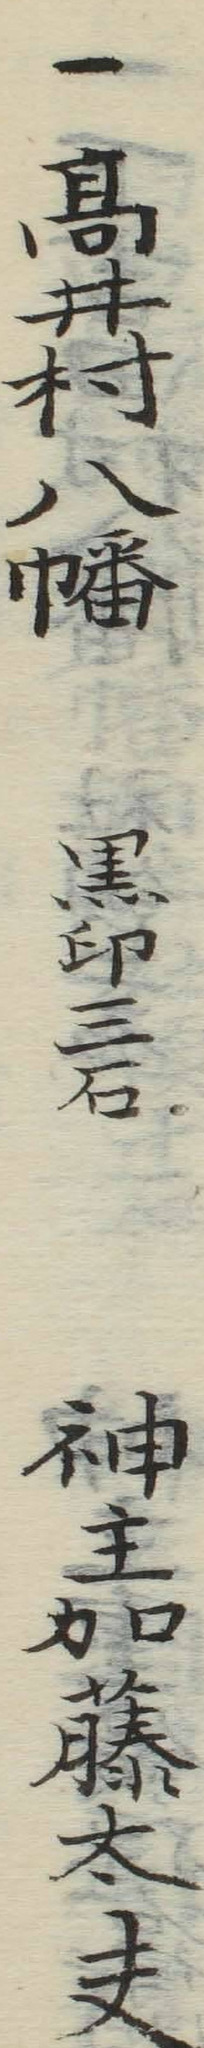一高井村八幡黒印三石神主加藤太夫
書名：三河国二葉松
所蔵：国文学研究資料館
